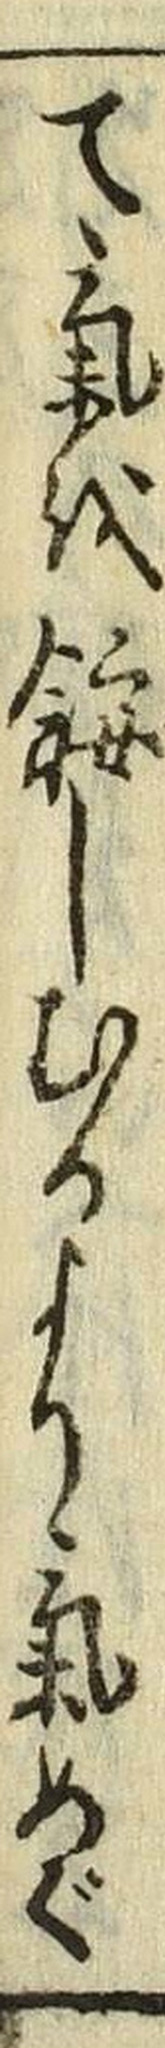て気を餒しむるより気めぐ
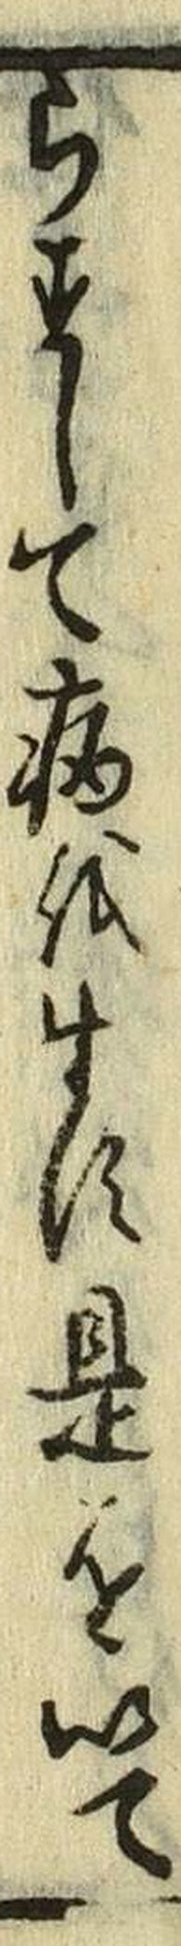らすして病を生す是を以て
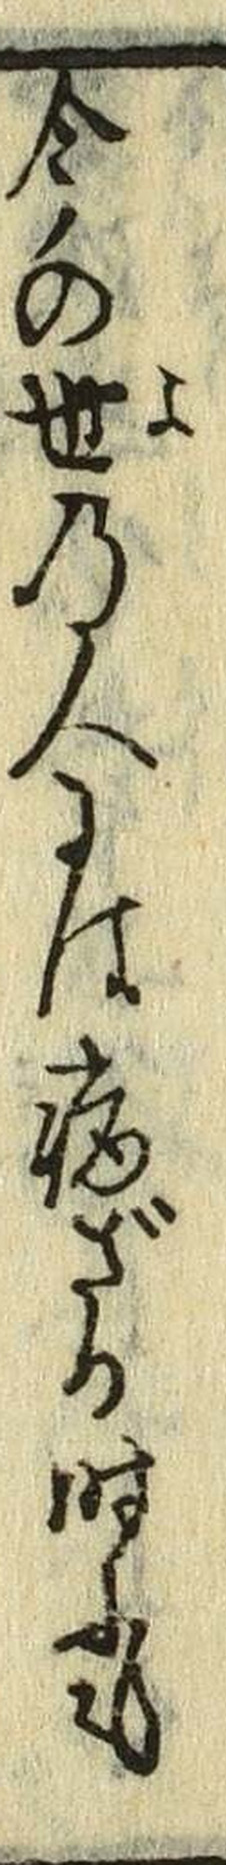今の世の人には病ざる時にも
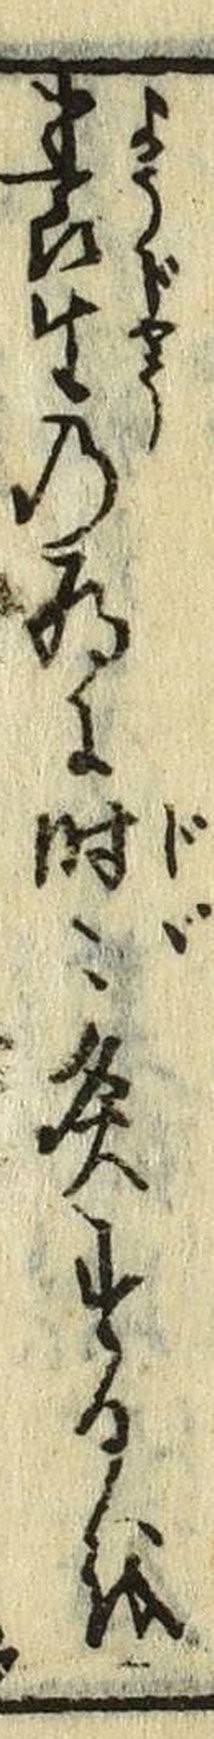養生の為に時々灸するを
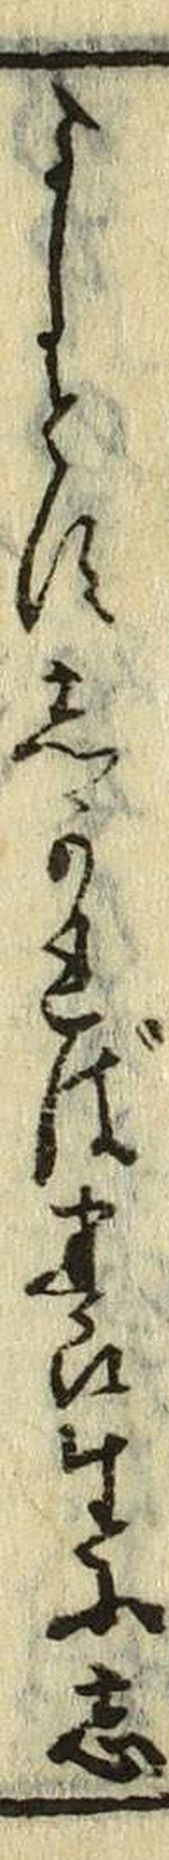よしとすしかれば養生に志
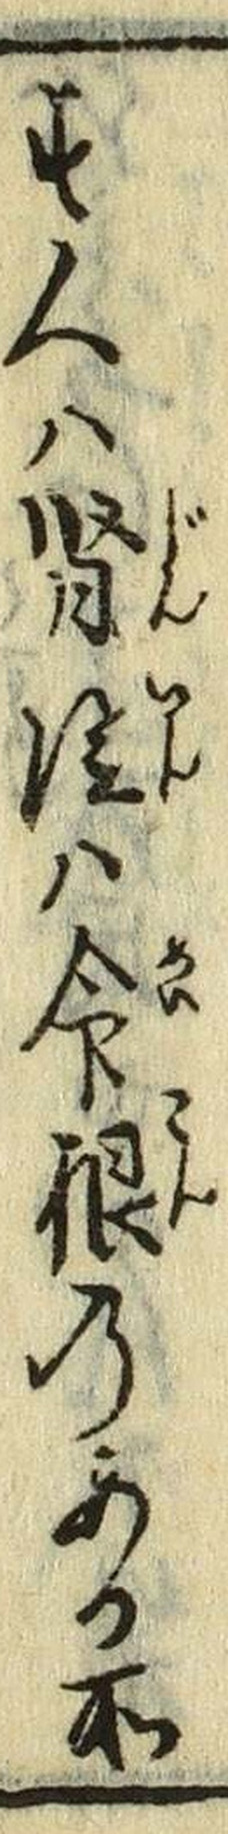す人は腎陰は命根のある所
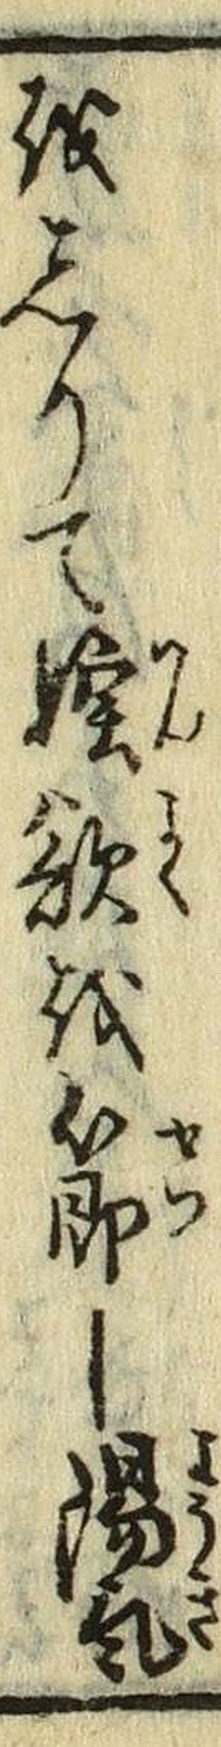をしりて婬欲を節し陽気
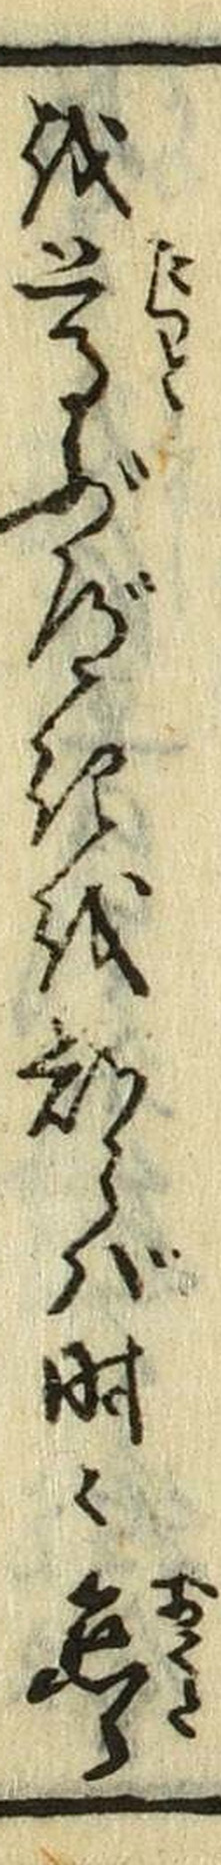を尊ぶべきを知らば時々怠ら
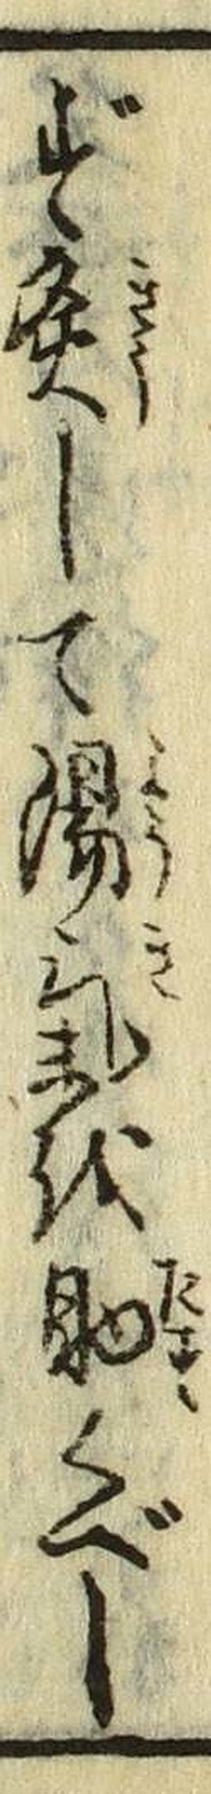ず灸して陽気を助くべし
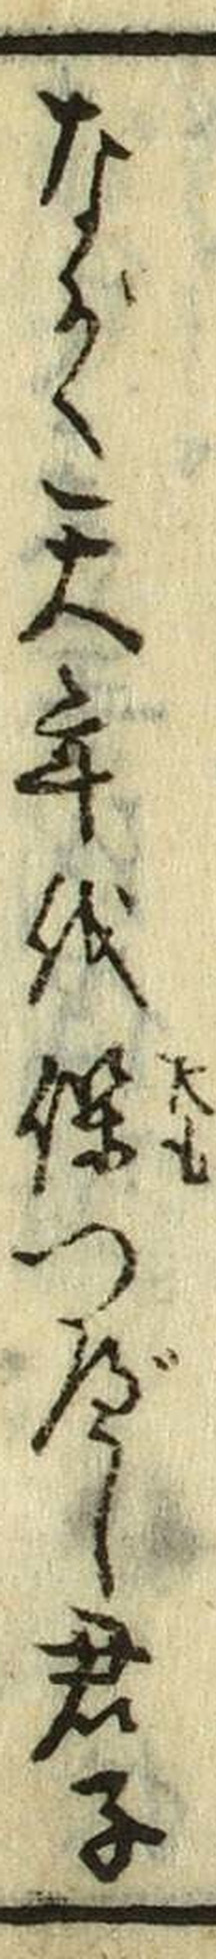ながく天年を保つべし君子
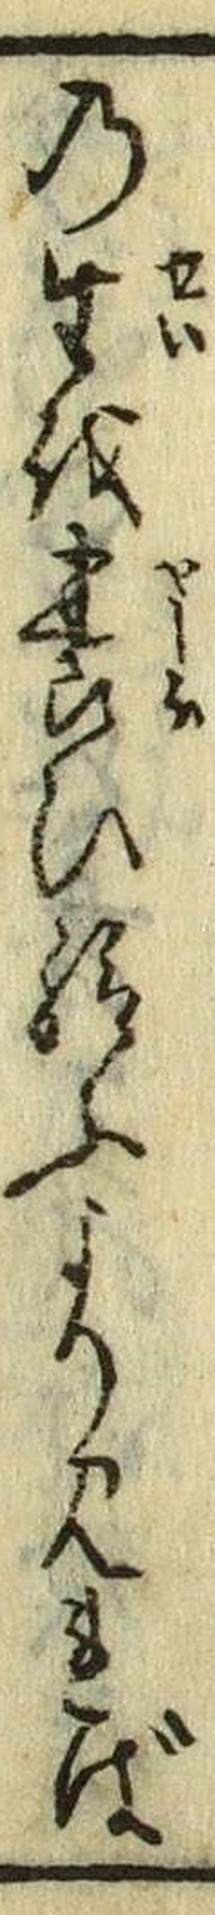の生を養ひ給ふより見れば
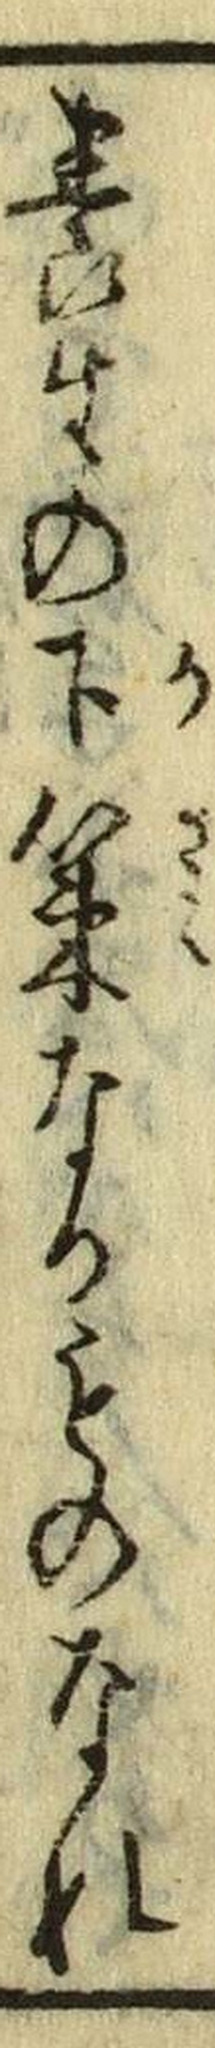養生の下策なるものなれ

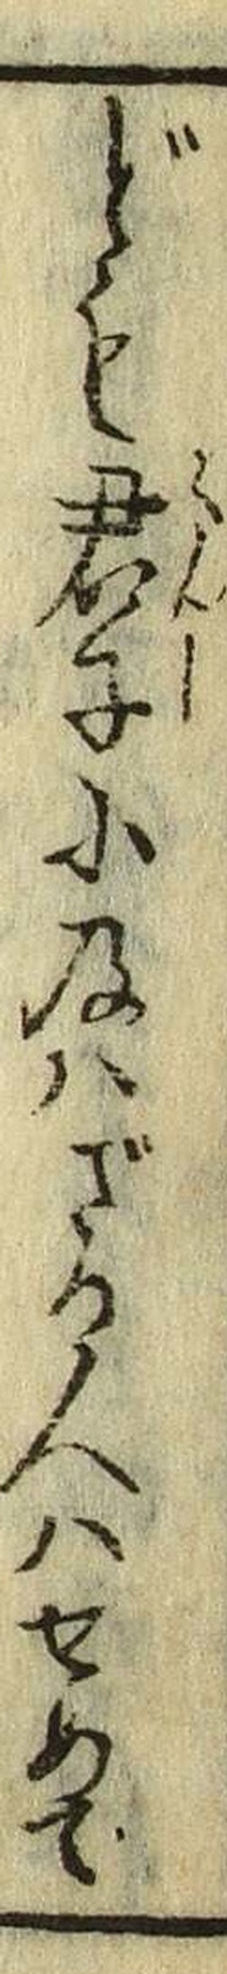ども君子に及はざる人はせめて
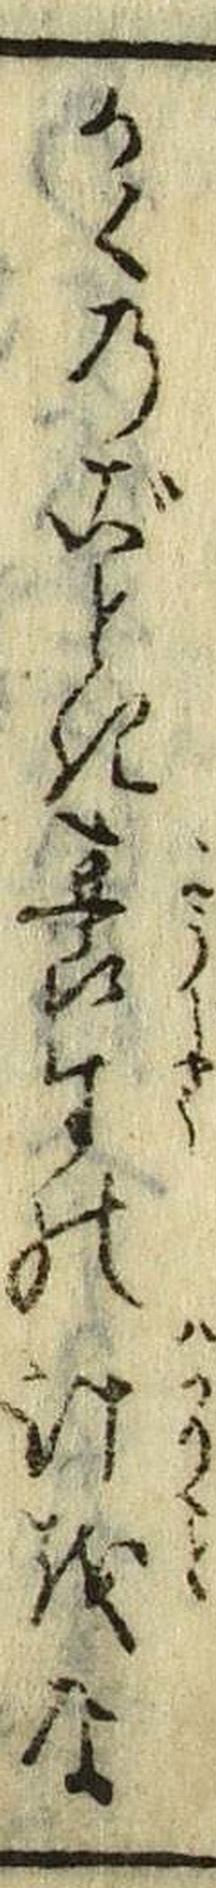かくのごとき養生の計をな
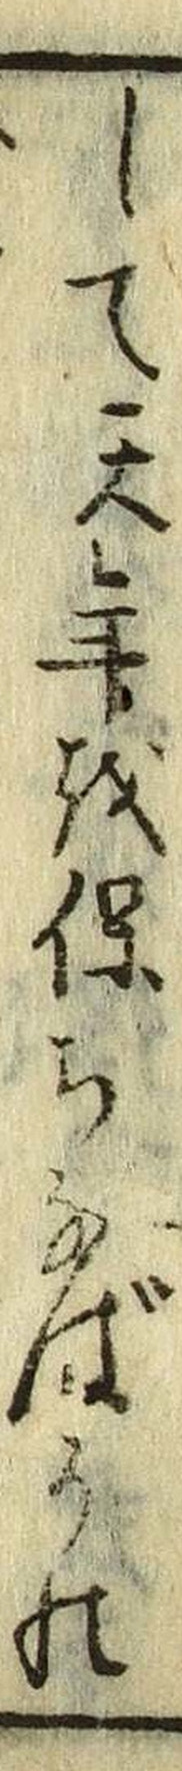して天年を保ちなばその
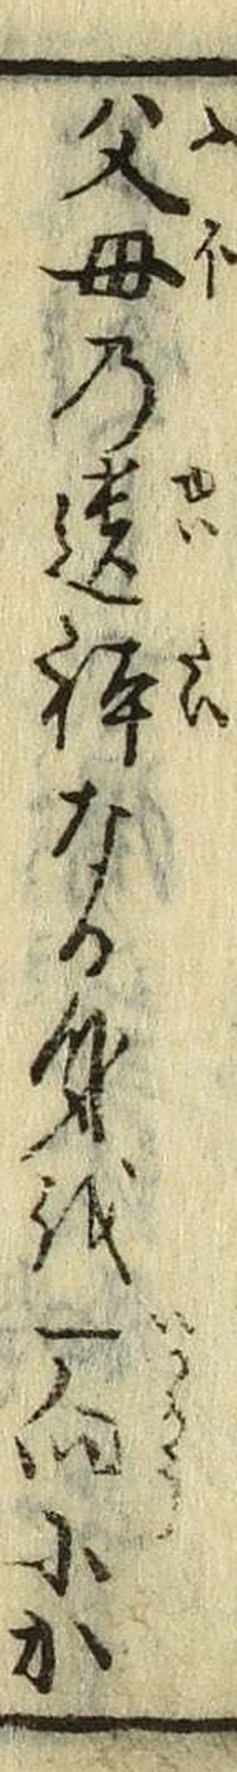父母の遺体なる身を一向にか
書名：居家養生記
